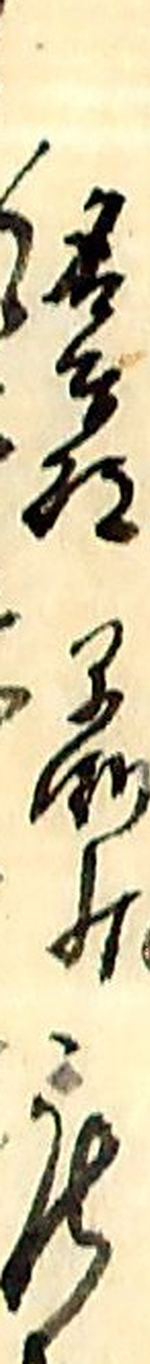名東郡早淵村庄屋
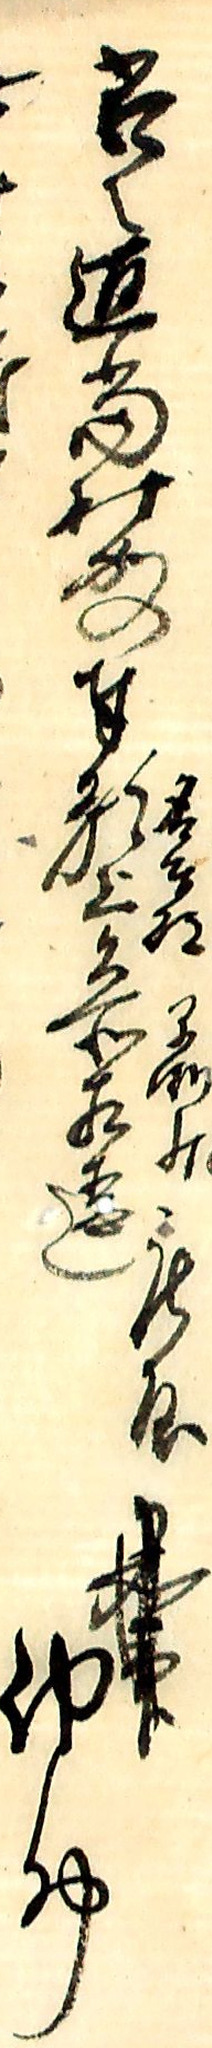右之通当村かの奉願上候所相違仲助
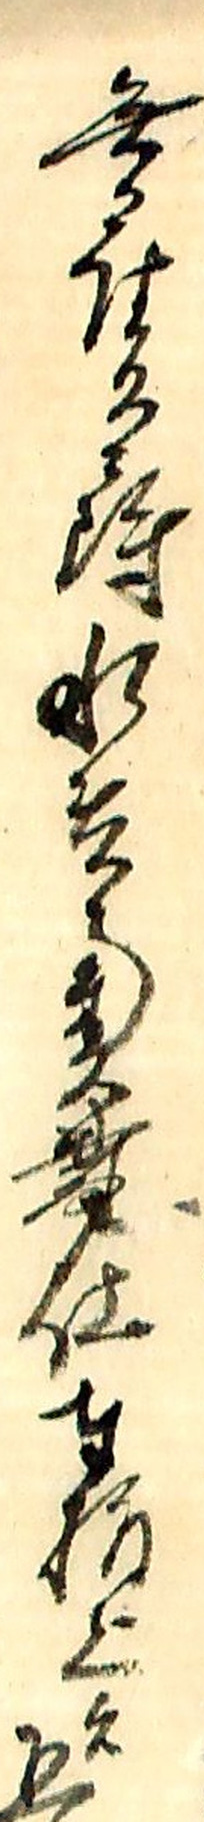無御座候附私共奥書仕奉指上候五人組
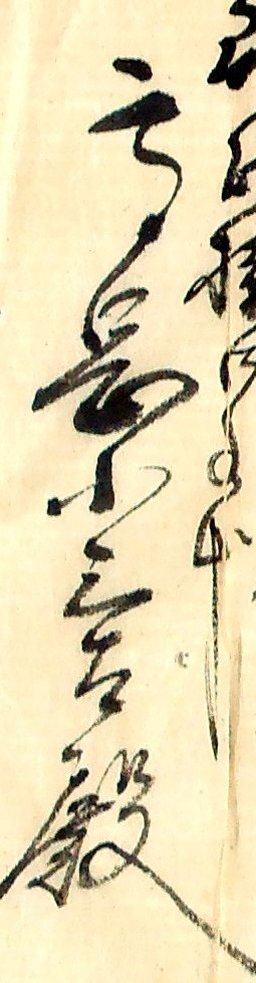高岡小三太殿
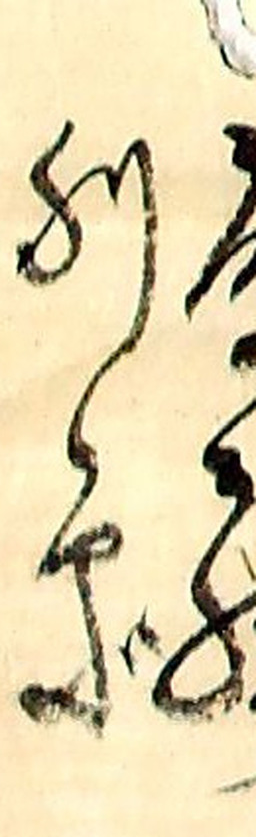利兵衛

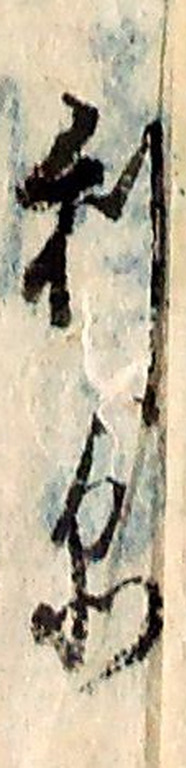利兵衛
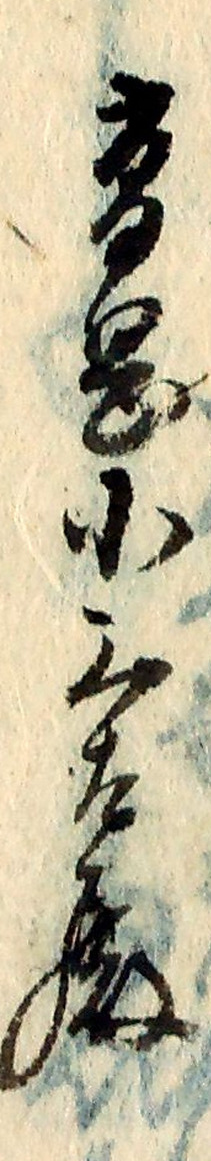高岡小三太殿
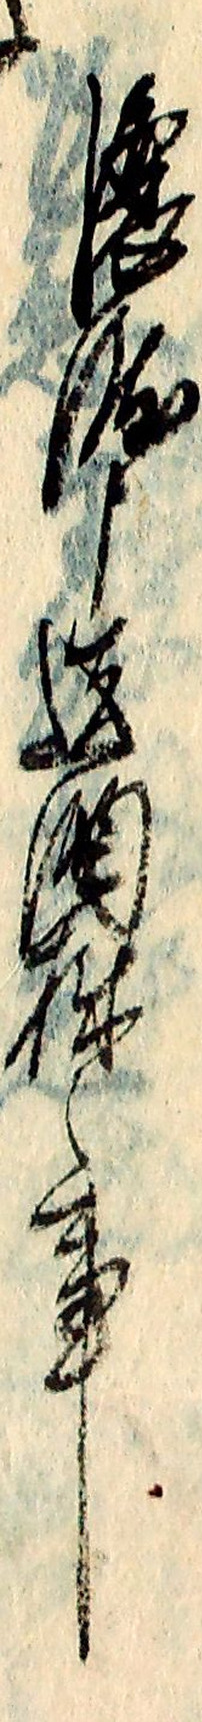譲渡申造酒株之事
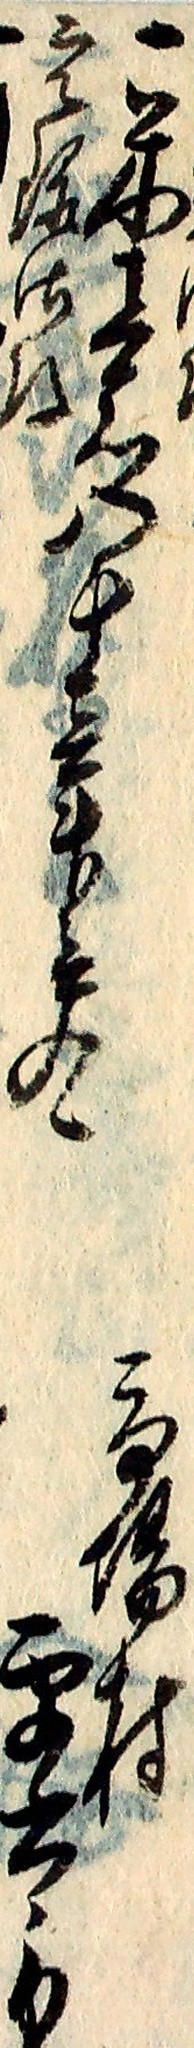一米壱石八斗壱升壱合平六兵衛
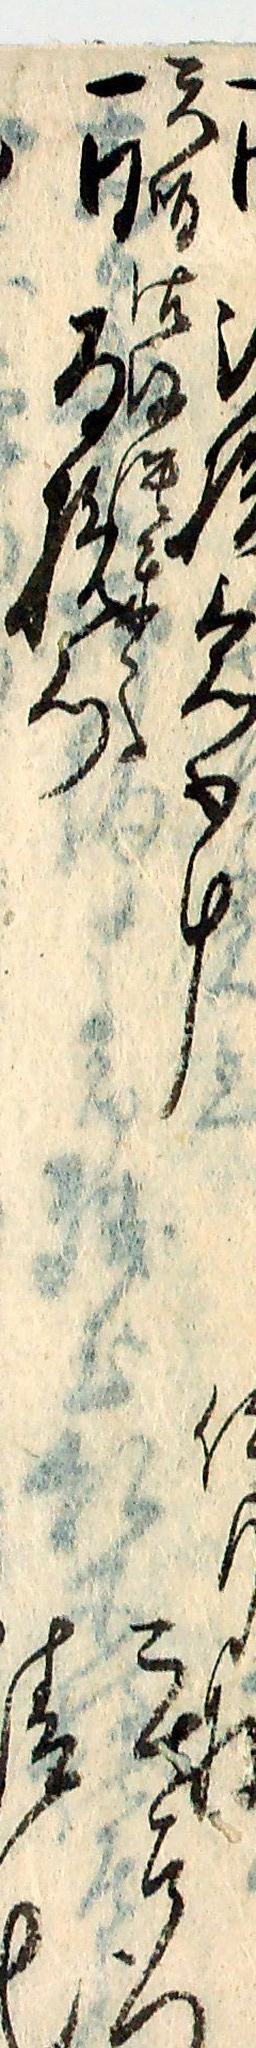一同百拾石清七
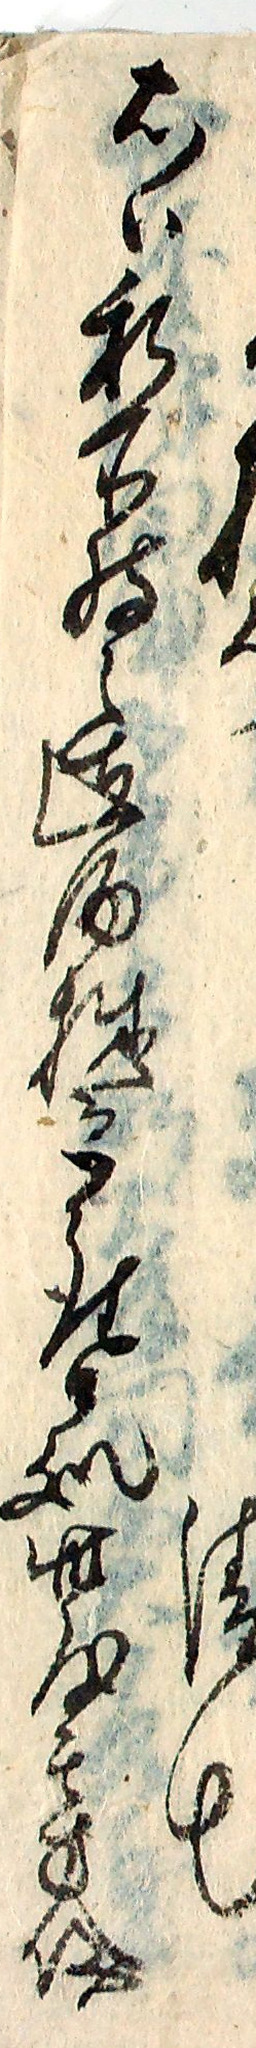右は私所持之造酒株にて御座候処此度其方儀

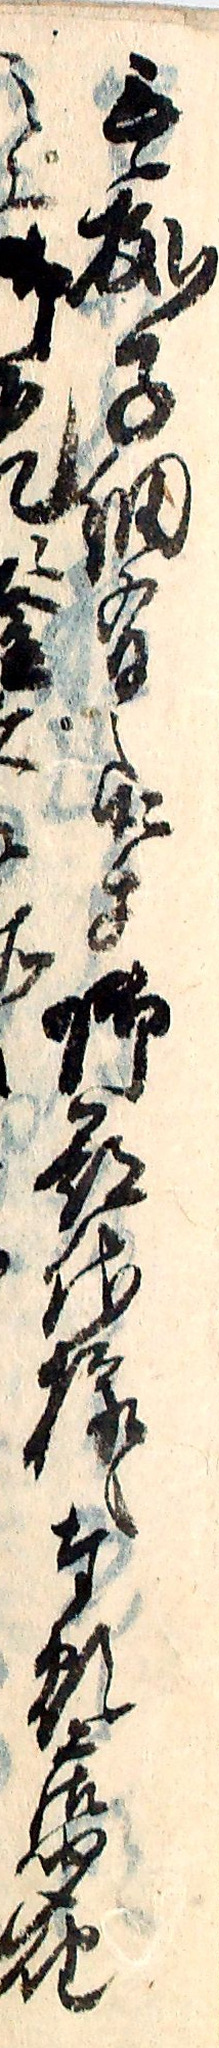無拠子細有之候に付御郡代様へ奉願上御聞届
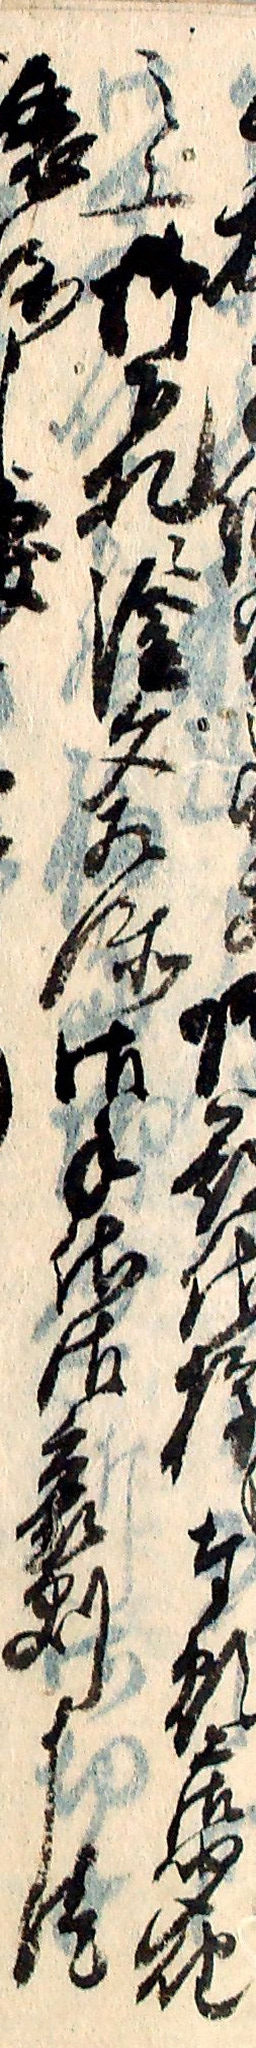之上御下札に証文相添御手代御裏判申請
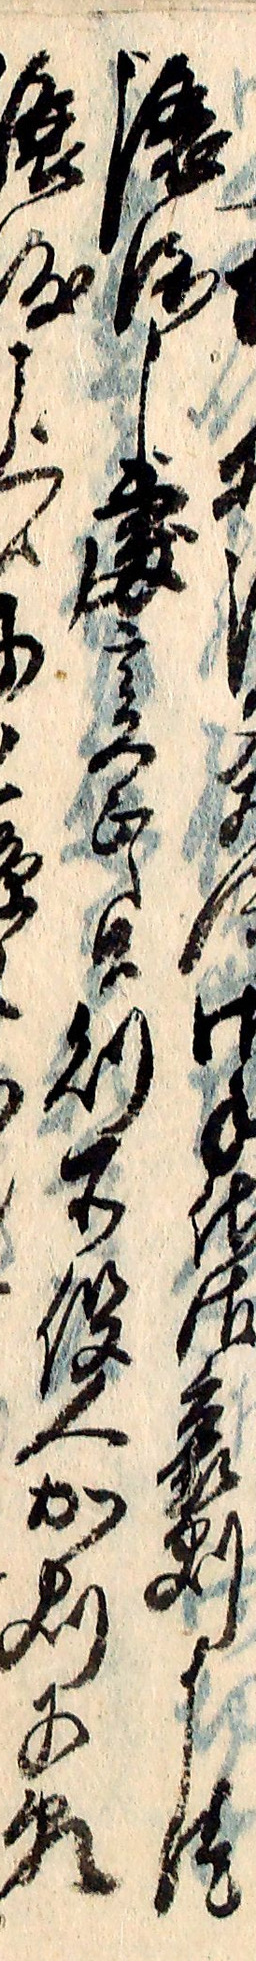譲渡申処実正に候則所役人加判相願
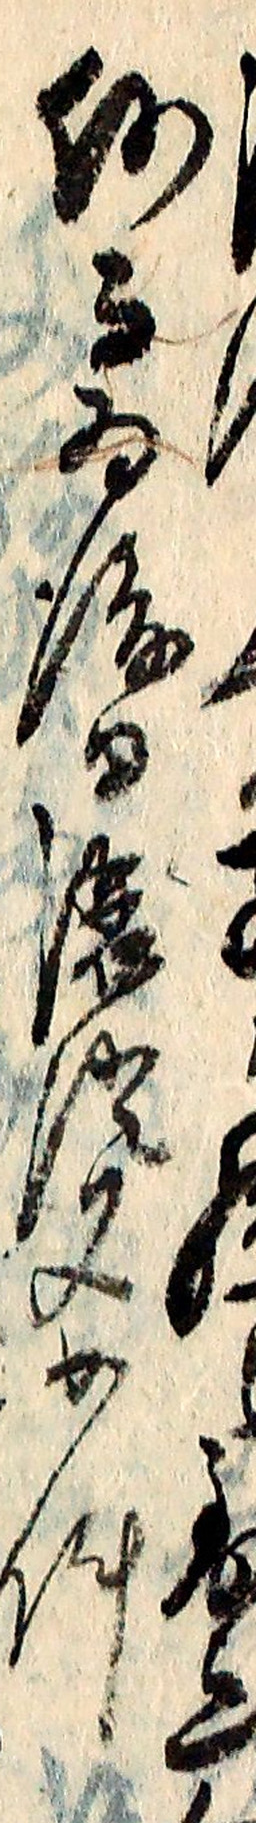仍て為後日譲証文如件
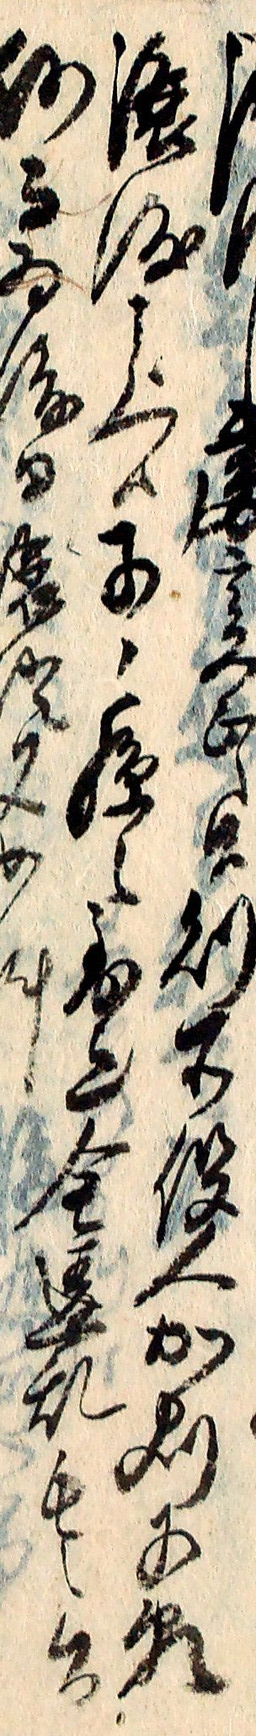譲渡申上候子々孫々至迄全違乱無之候
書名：諸御願書控(後藤氏壱番）
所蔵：鳴門教育大学 Naruto University of Education
